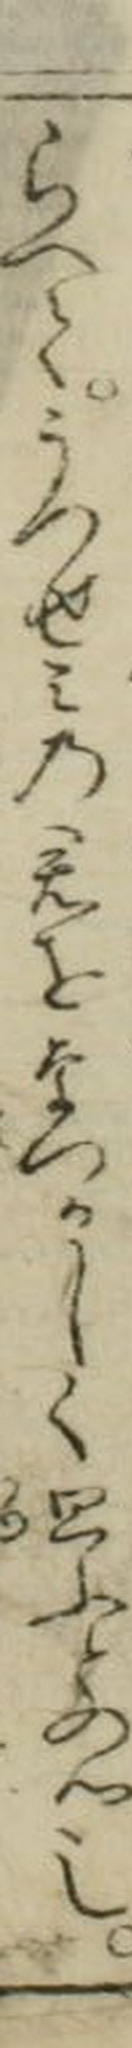らへて。うつせみの君をなつかしく思ふとの心也。
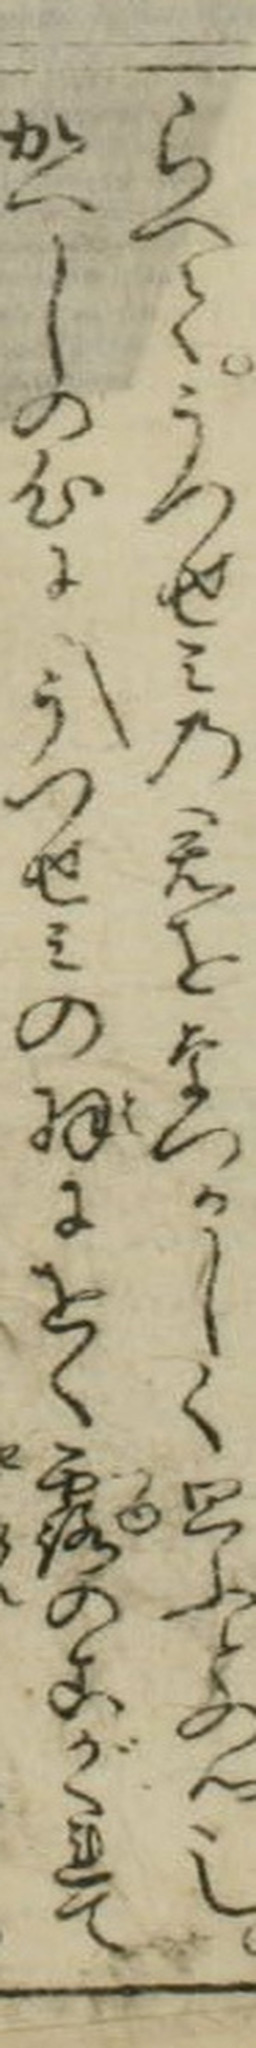かへしの心に〽うつせみの羽にをく露のこがくれて
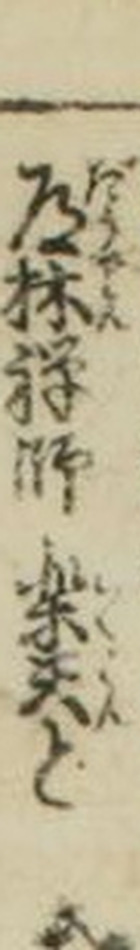道林禅師楽天と
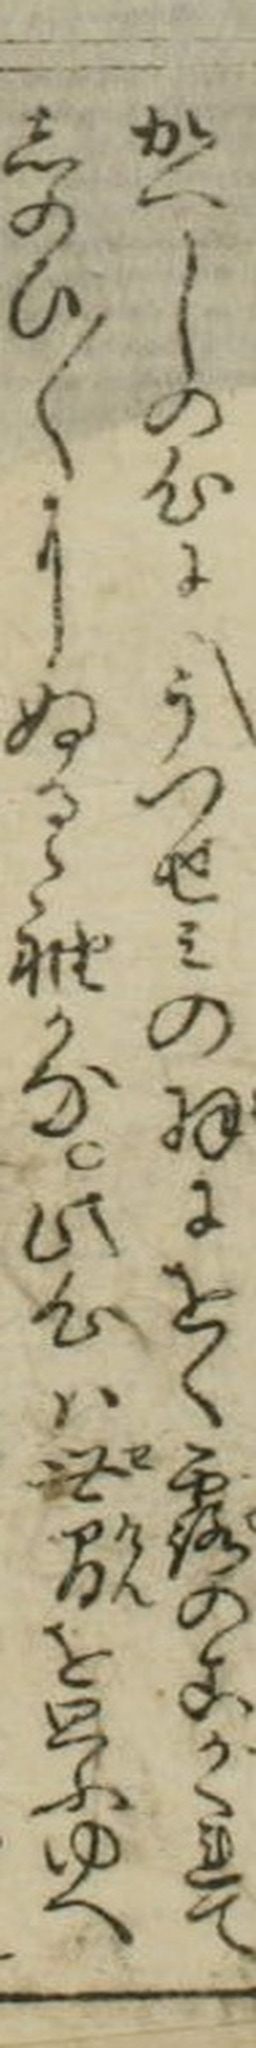しのひ〳〵にぬるゝ袖かな。此心は世間を思ふゆへ
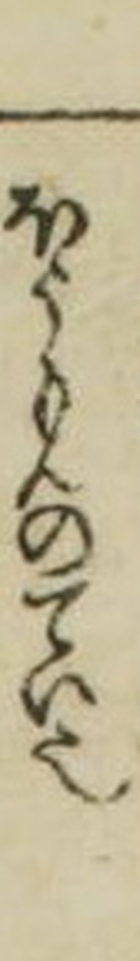ほうもんのてい也
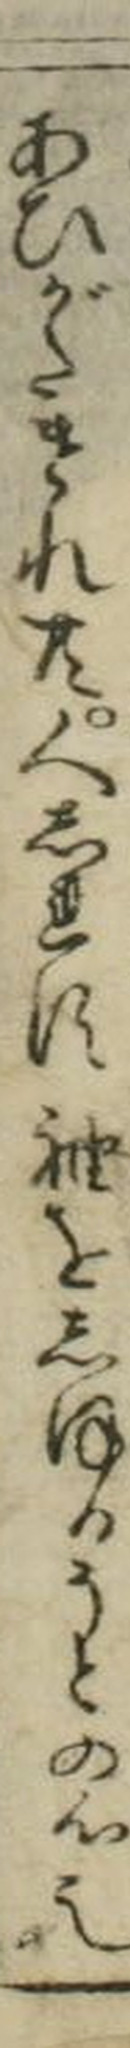あひがたけれ共。人しれす袖をしほるそとの心也
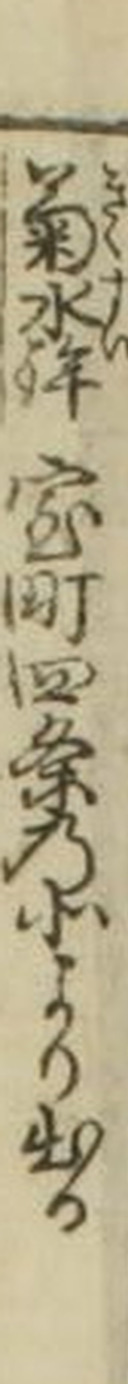菊水鉾室町四条の北より出る
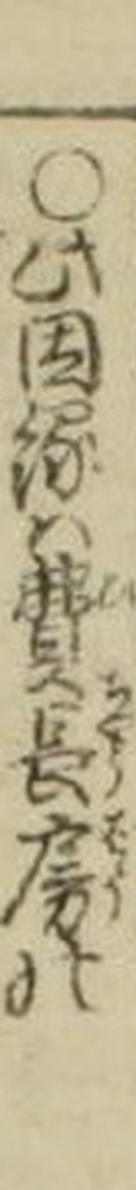〇此因縁は費長房の
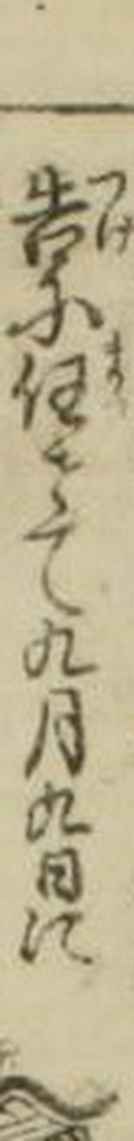告に任せて九月九日に
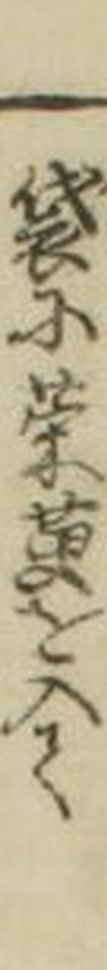袋に茱萸を入て
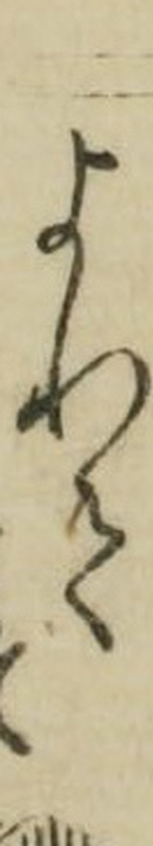よりて
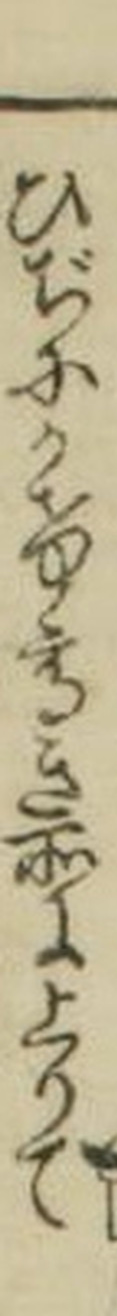ひぢにかけ高き所に上りて
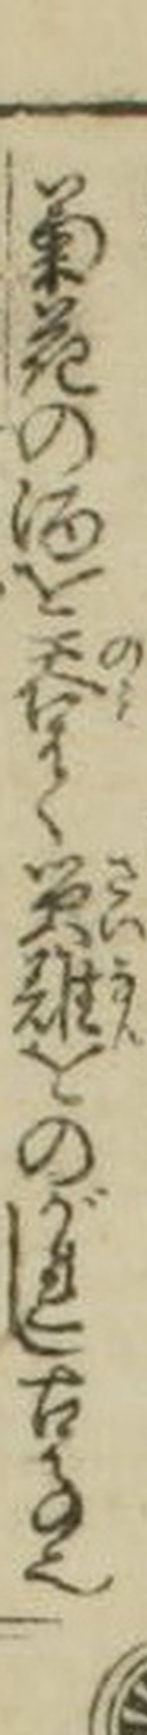菊花の酒を呑て災難をのがれし古事也
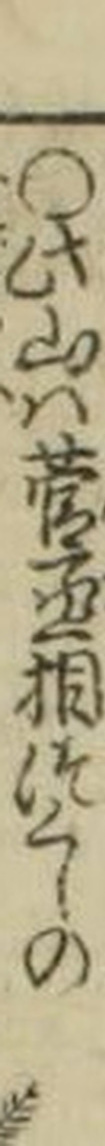〇此山は菅丞相つくしの
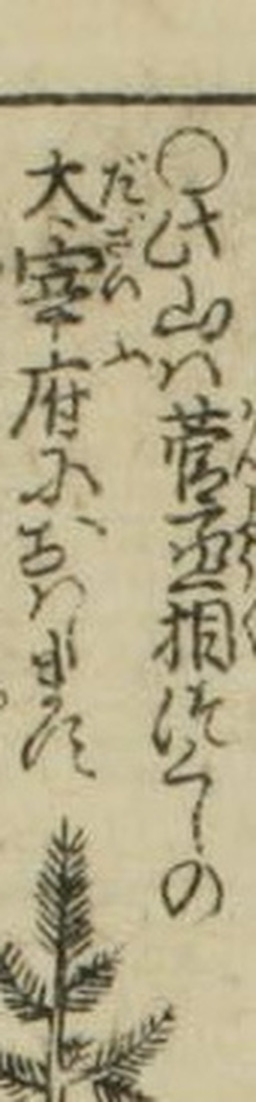大宰府におはします
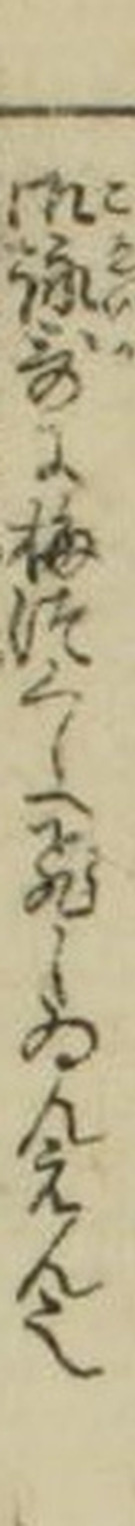御詠哥に梅つくしへ飛しゐんえん也
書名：女源氏教訓鑑
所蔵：東京学芸大学附属図書館
